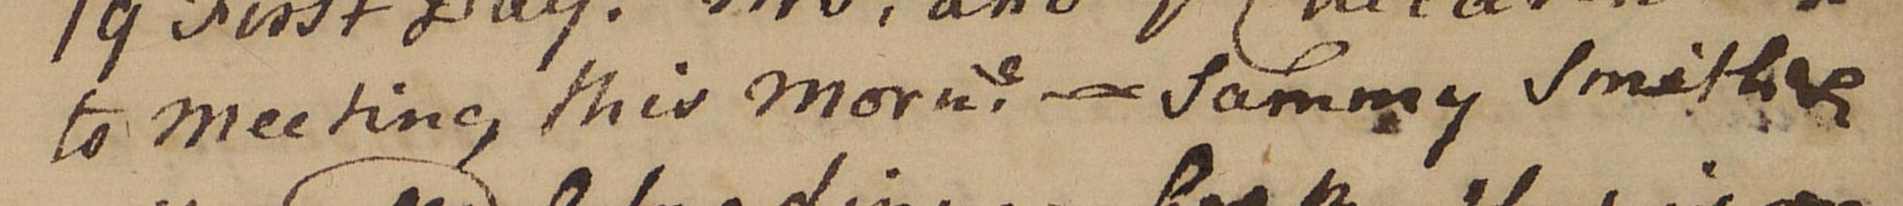to meeting, this morn^g- Sammy Smith &
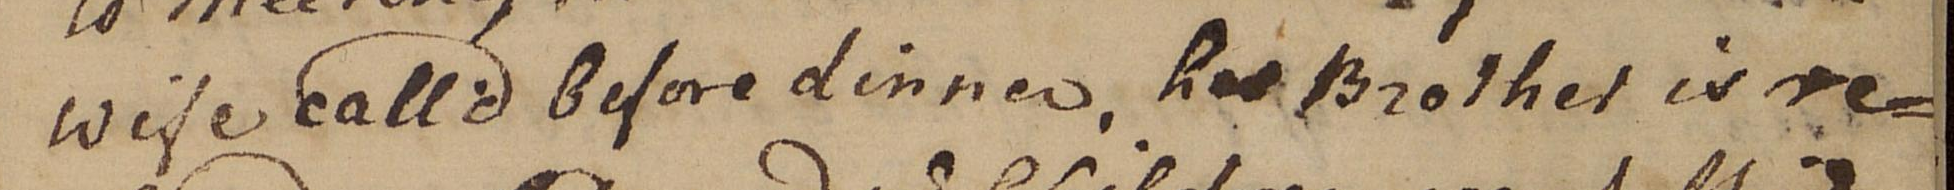Wife call'd before dinner, his Brother is re-
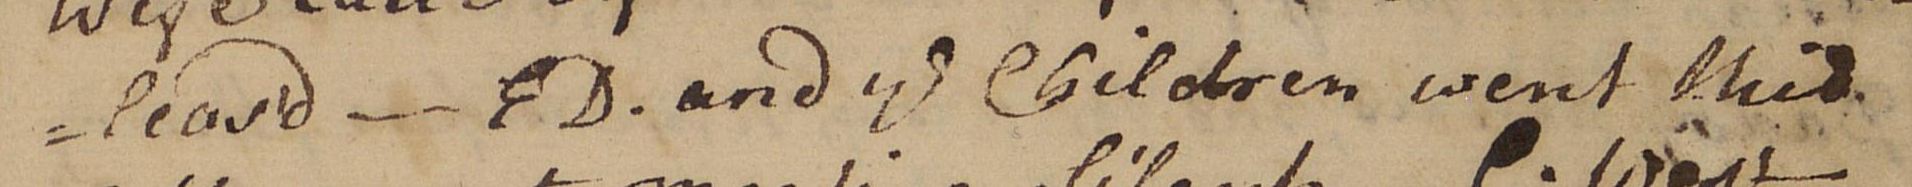-leas'd- ED. and y^e Children went this
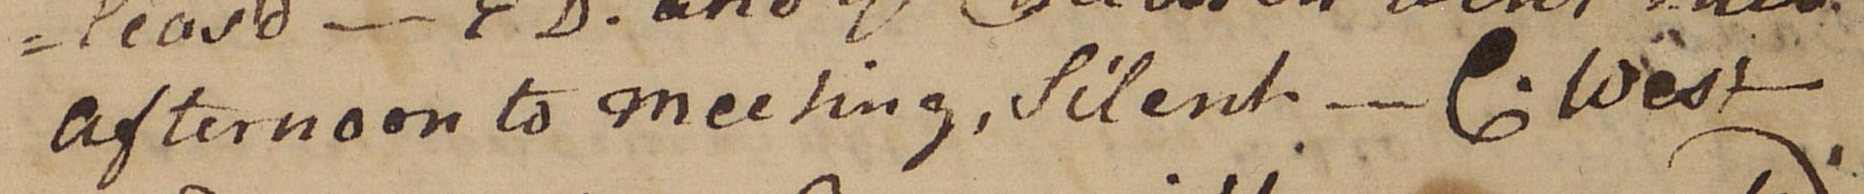Afternoon to meeting, Silent- C. West
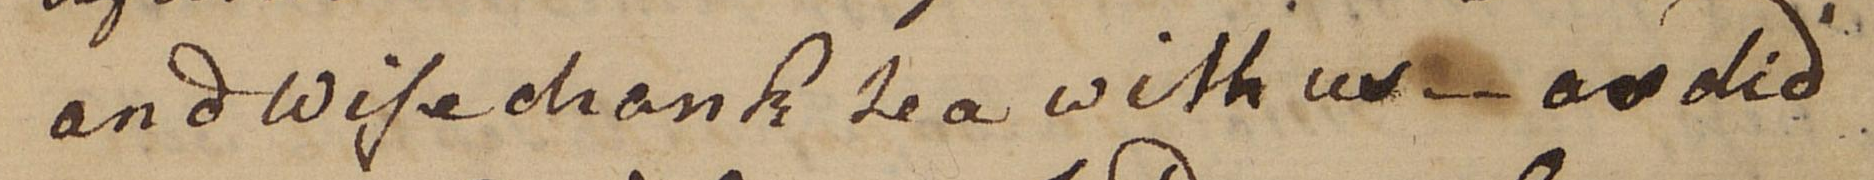and Wife drank tea with us- as did
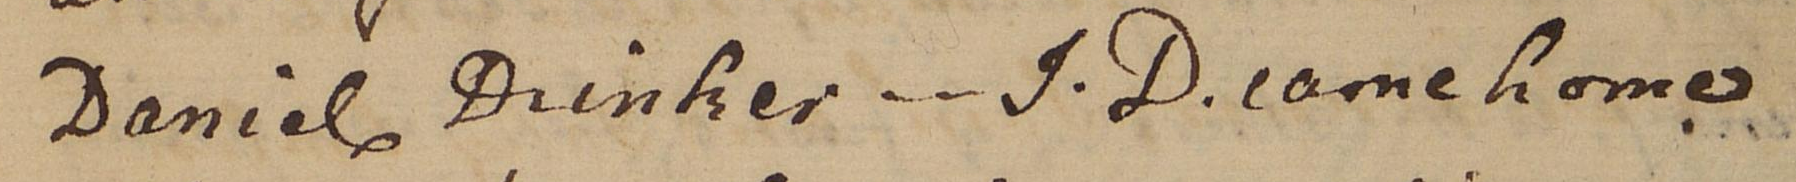Daniel Drinker- J. D. came home
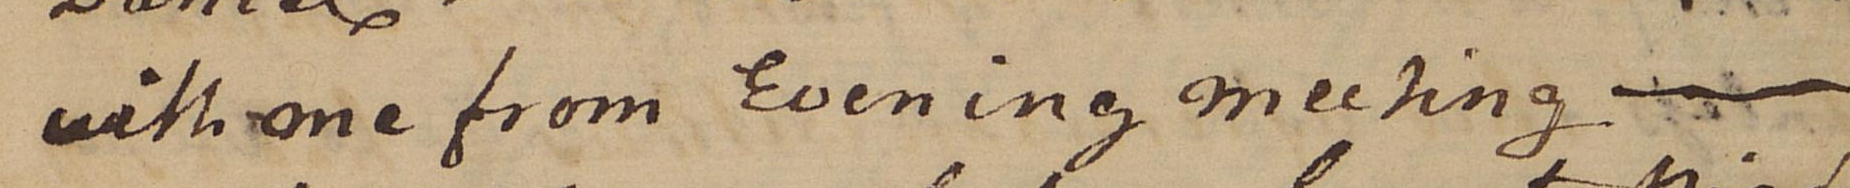with me from Evening meeting-
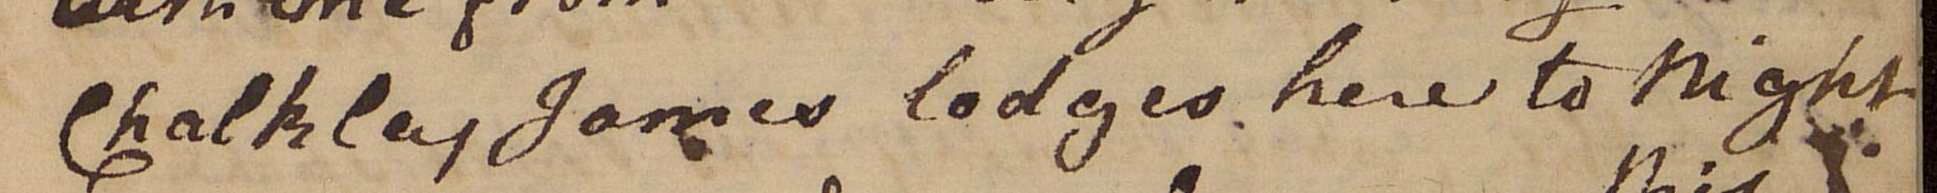Chalklay James lodges here to Night
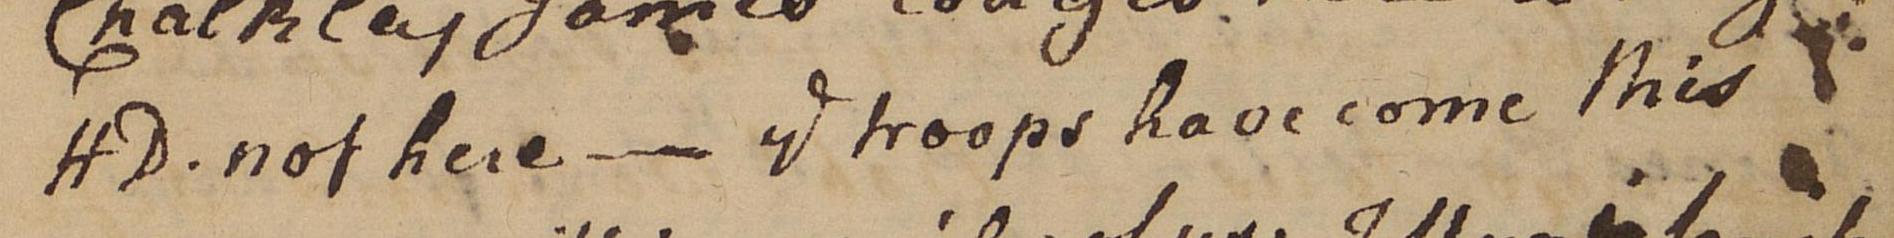HD. not here- y^e troops have come this
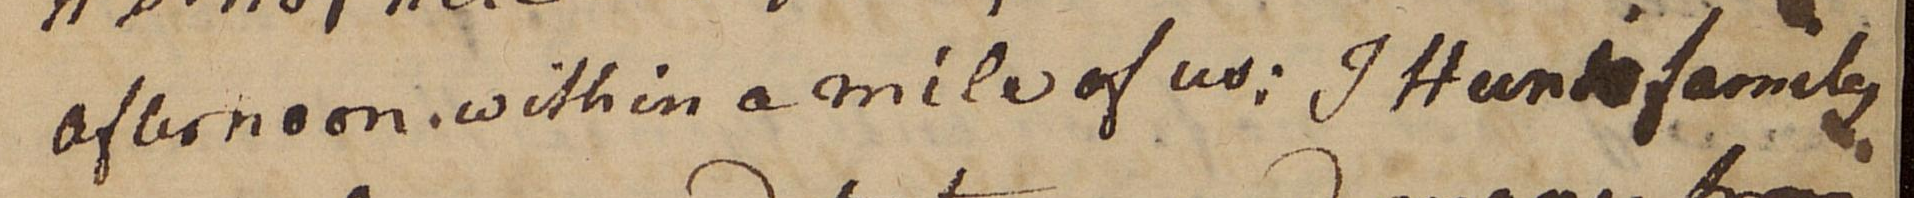afternoon within a mile of us: I Hunt's family
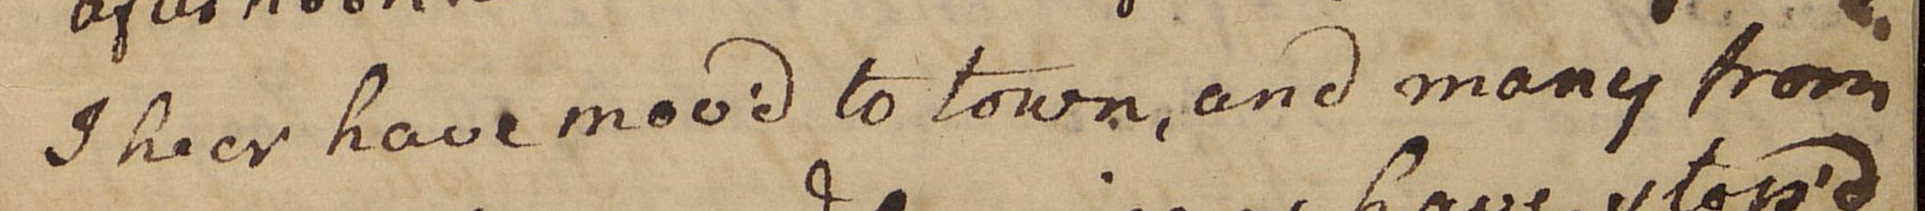I hear have mov'd to town, and many from
